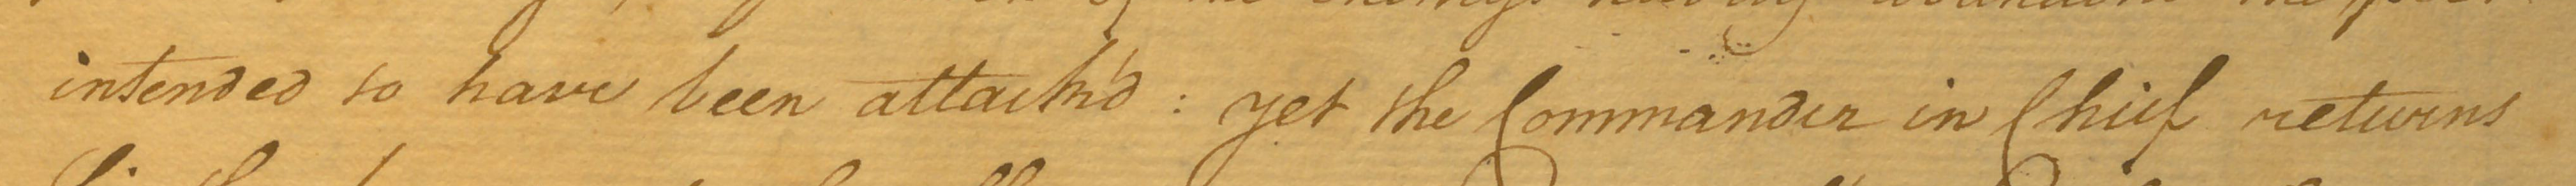intended to have been attack'd: yet the Commander in Chief returns
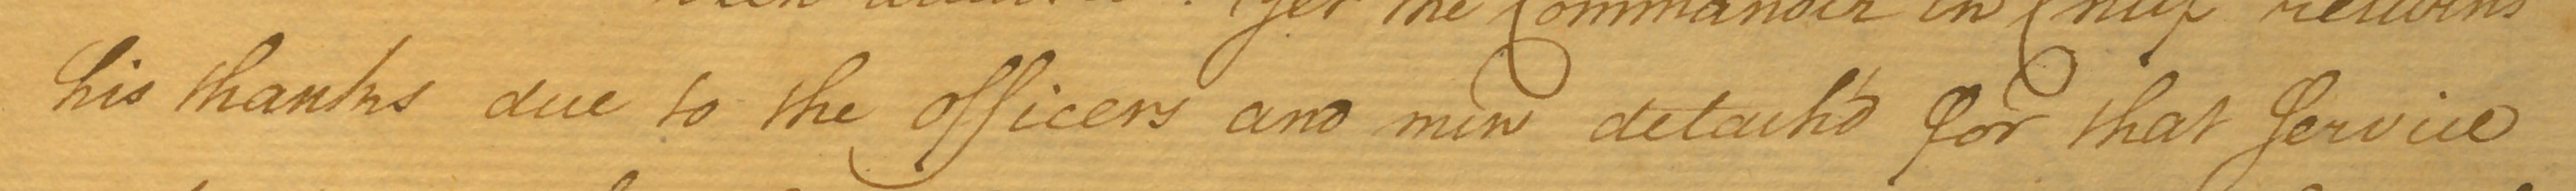his thanks due to the officers and men detach'd for that Service
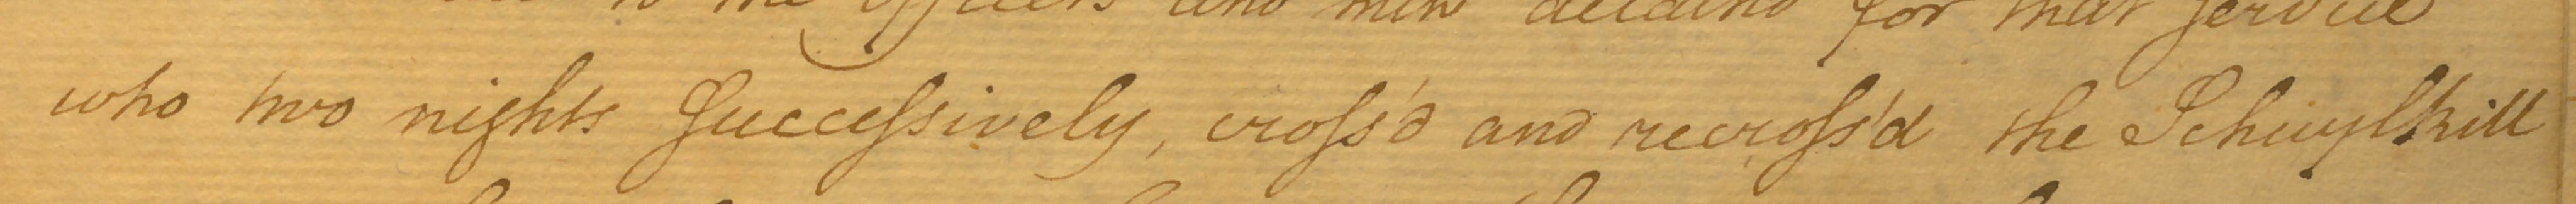who two nights Successively, cross'd and recross'd the Schuylkill
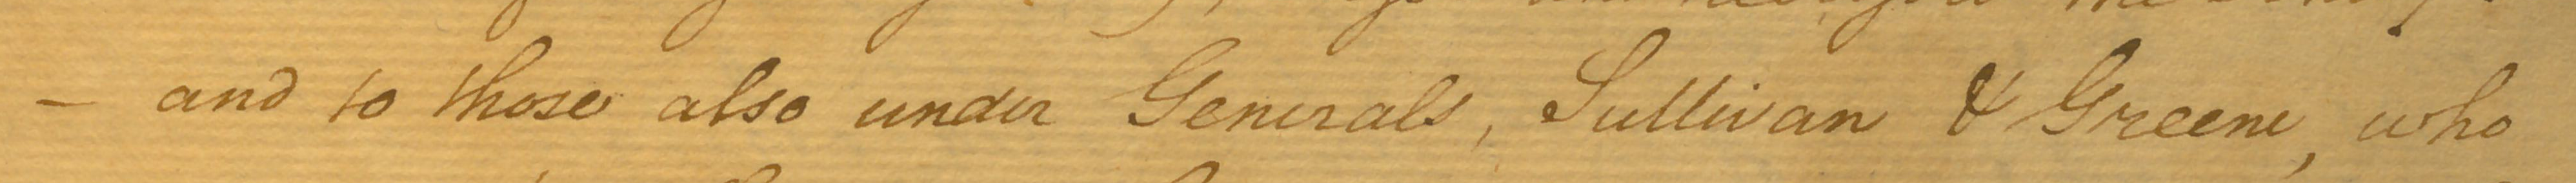- and to those also under General Sullivan & Greene, who
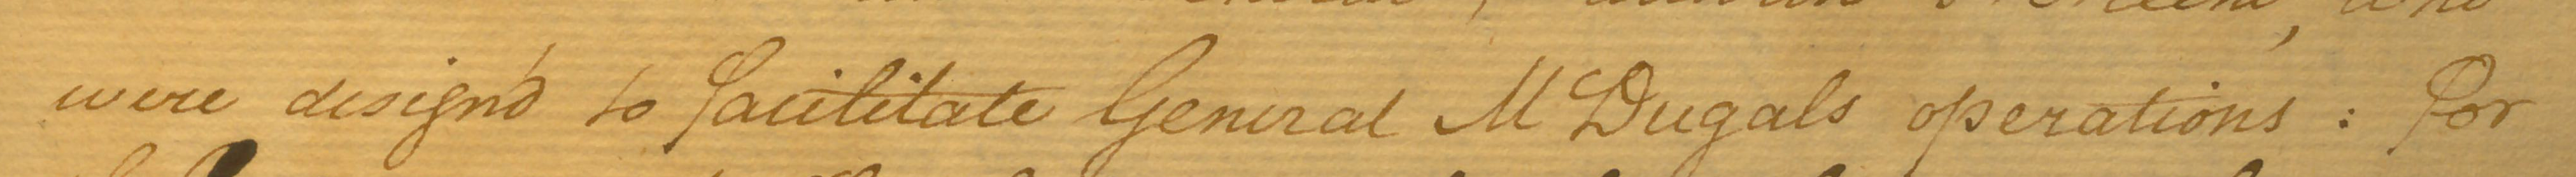were design'd to facilitate General M^cDugals operations: for
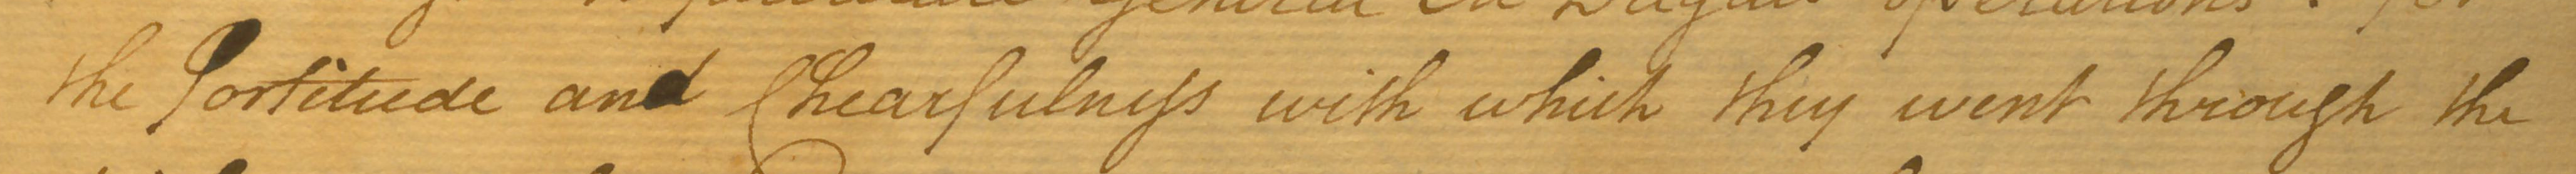the fortitude and Chearfulness with which they went through the
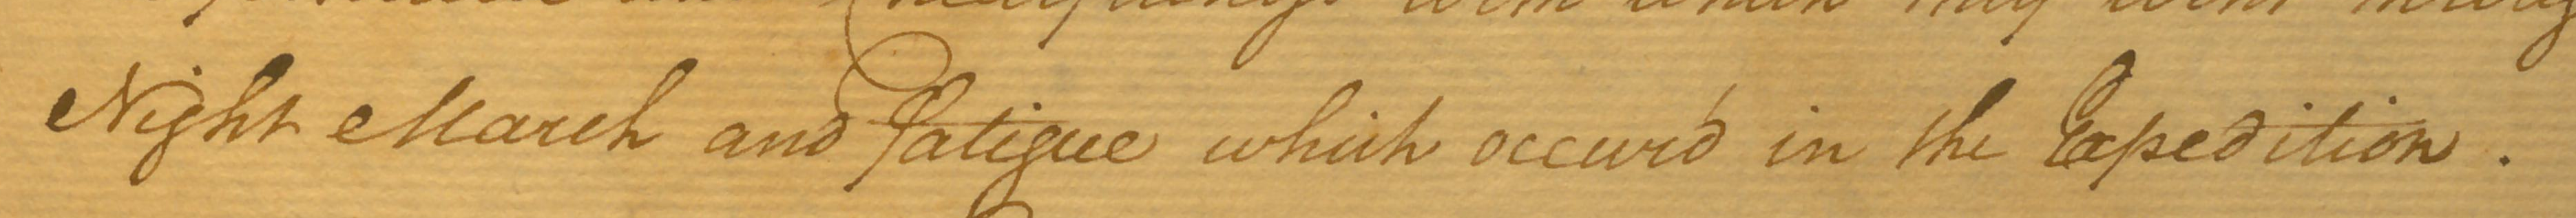Night March and fatigue which occur'd in the Expedition.
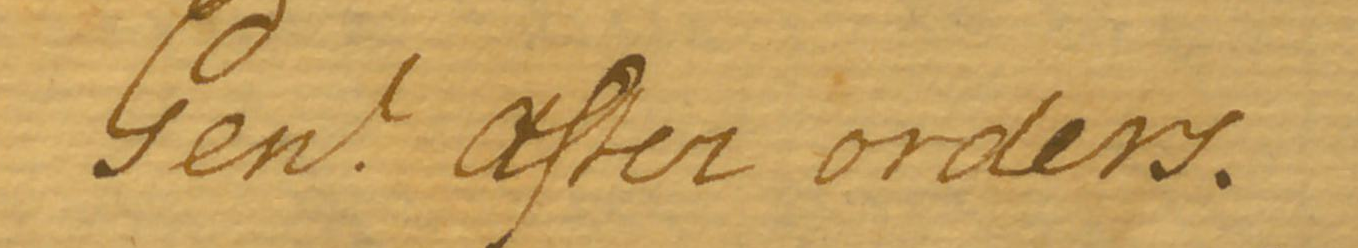Gen^l. after orders.
